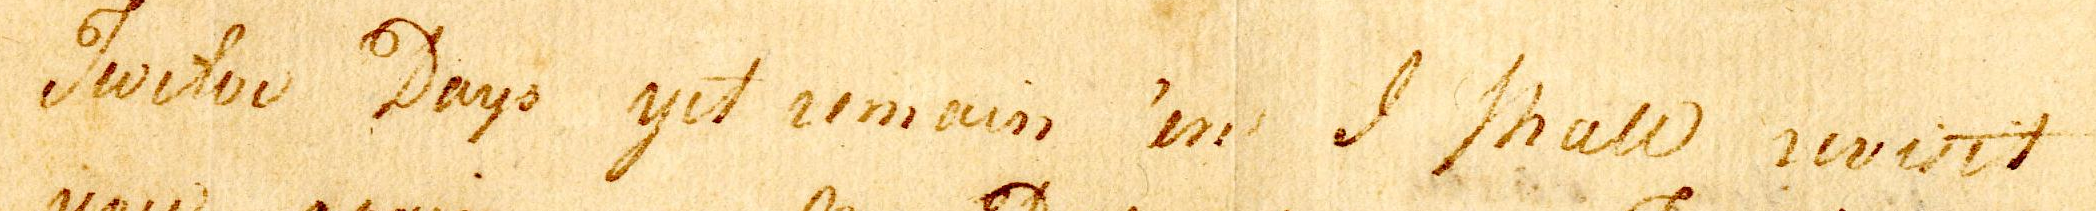Twelve Days yet remain 'en I shall writ
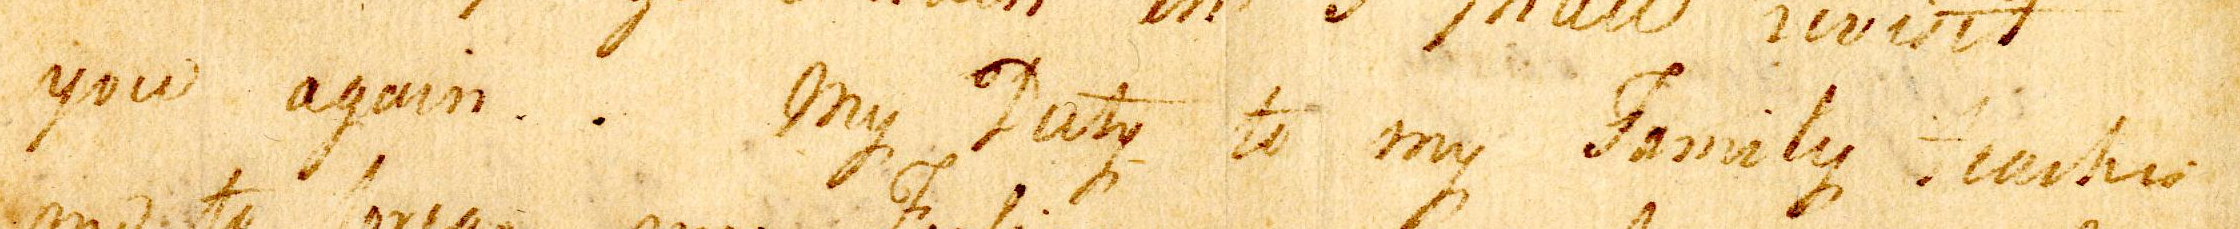you again. My Duty to my Family Teaches
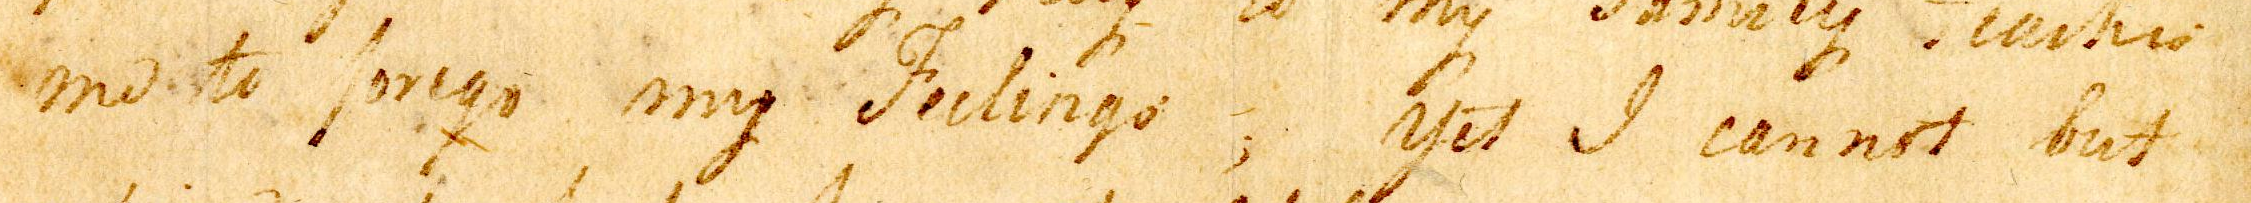me to forego my Feelings; yet I cannot but
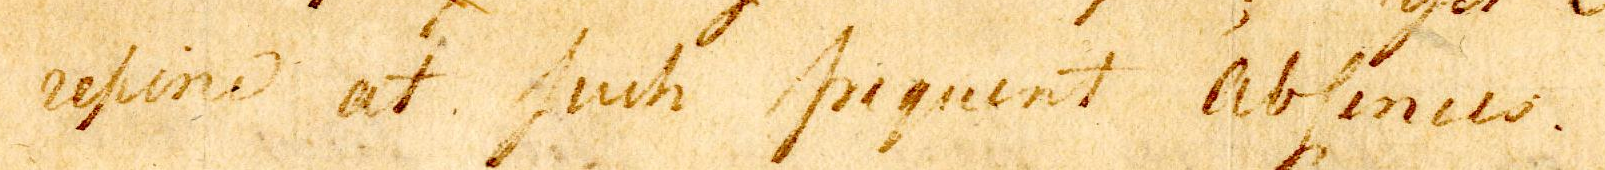repine at such frequent absences.
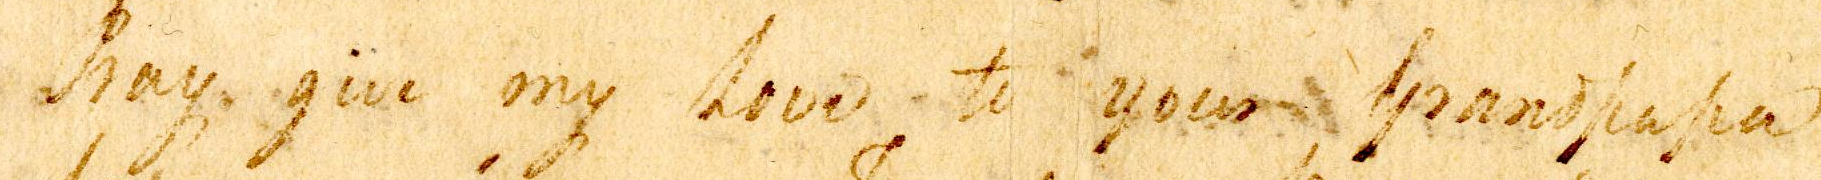Pray give my Love to your Grandpapa
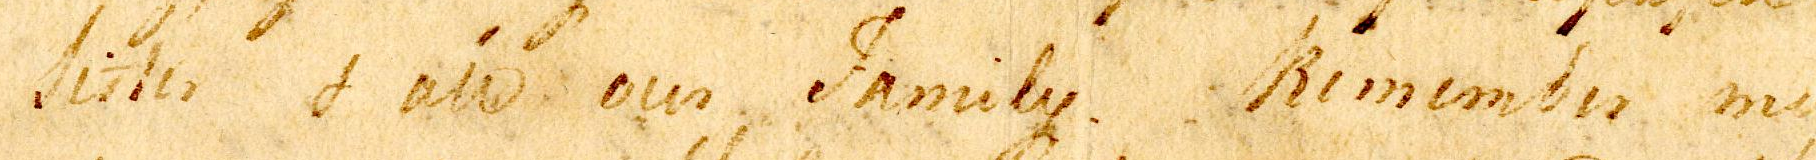Sister & all our Family. Remember me
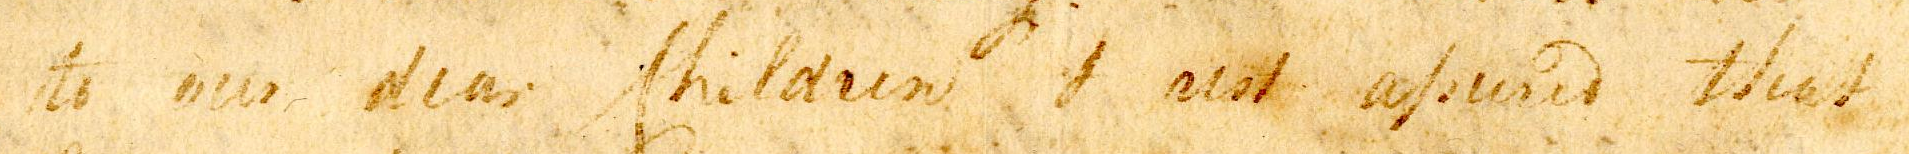to our dear Children I rest assured that
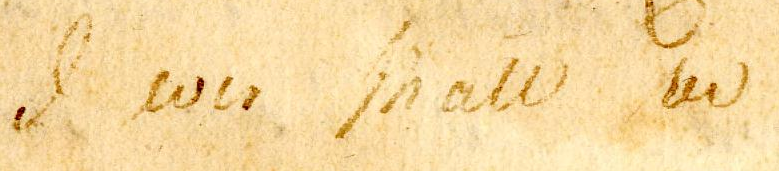I ever shall be
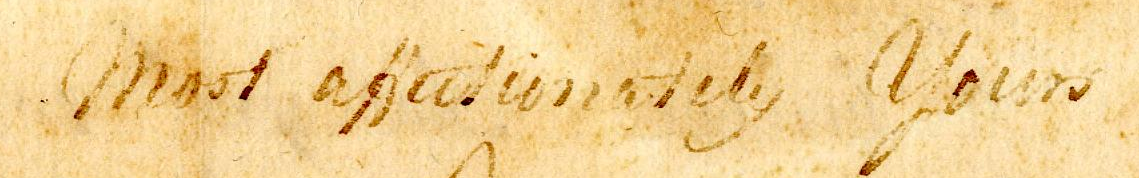Most affectionately Yours
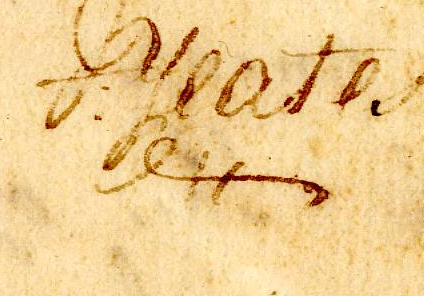J: Yeates
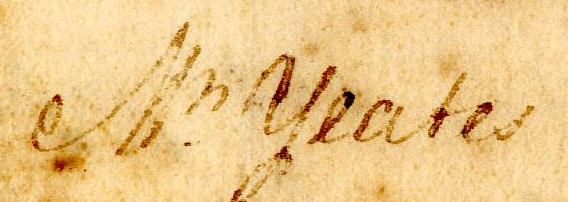M^r. Yeates
